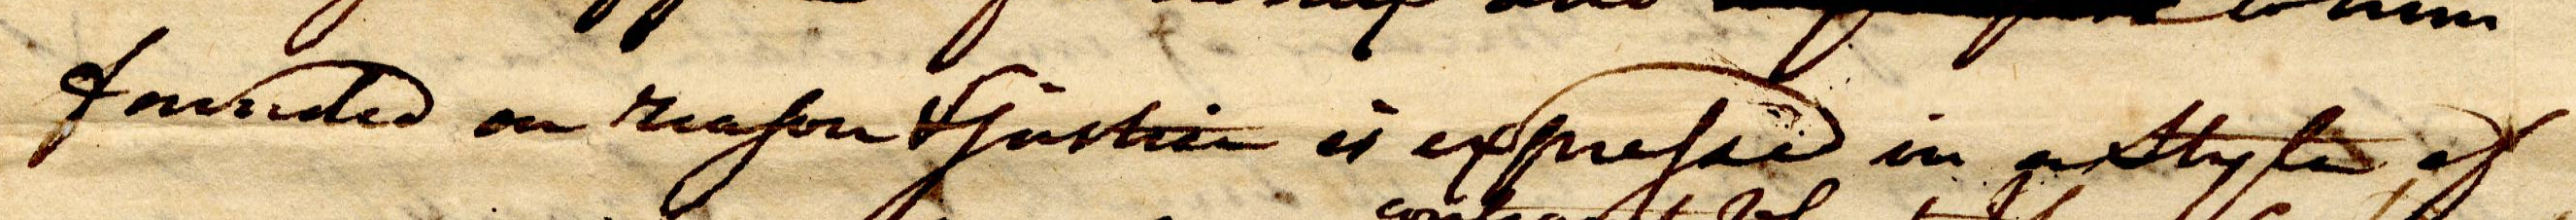founded on reason & justice is expressed in a style of
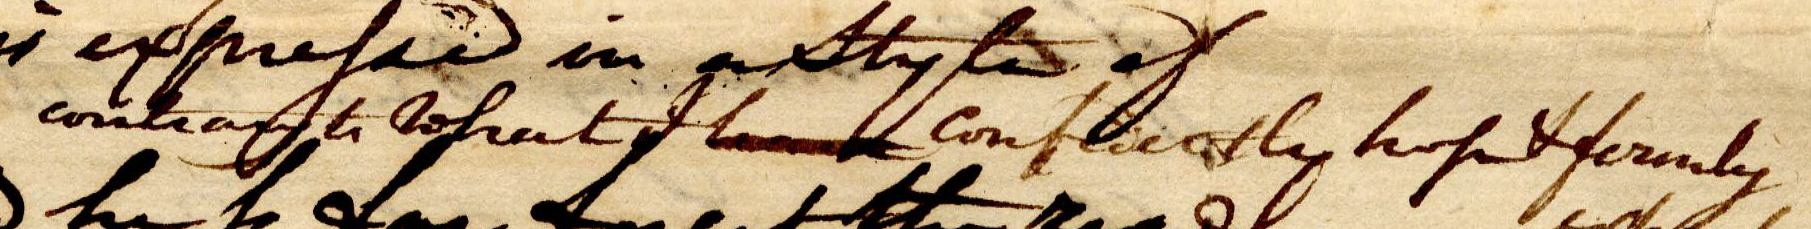contrary to what I [____] confidently hope & firmly
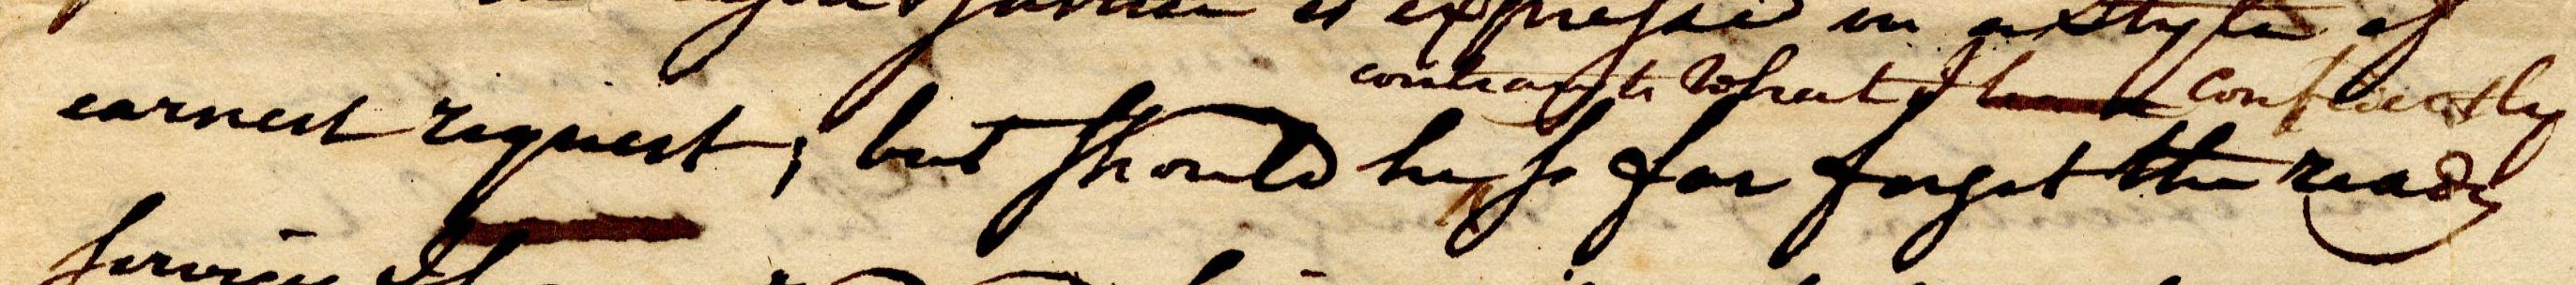earnest request, but should he so far forget the ready
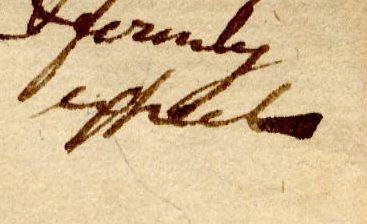expect
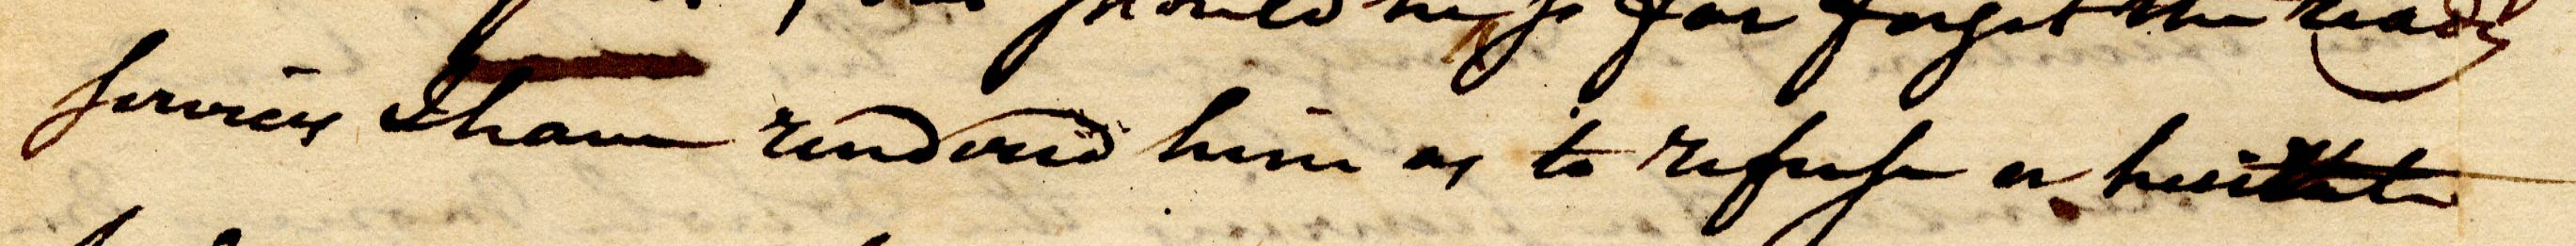survey I have rendered him as to refuse or hesitate
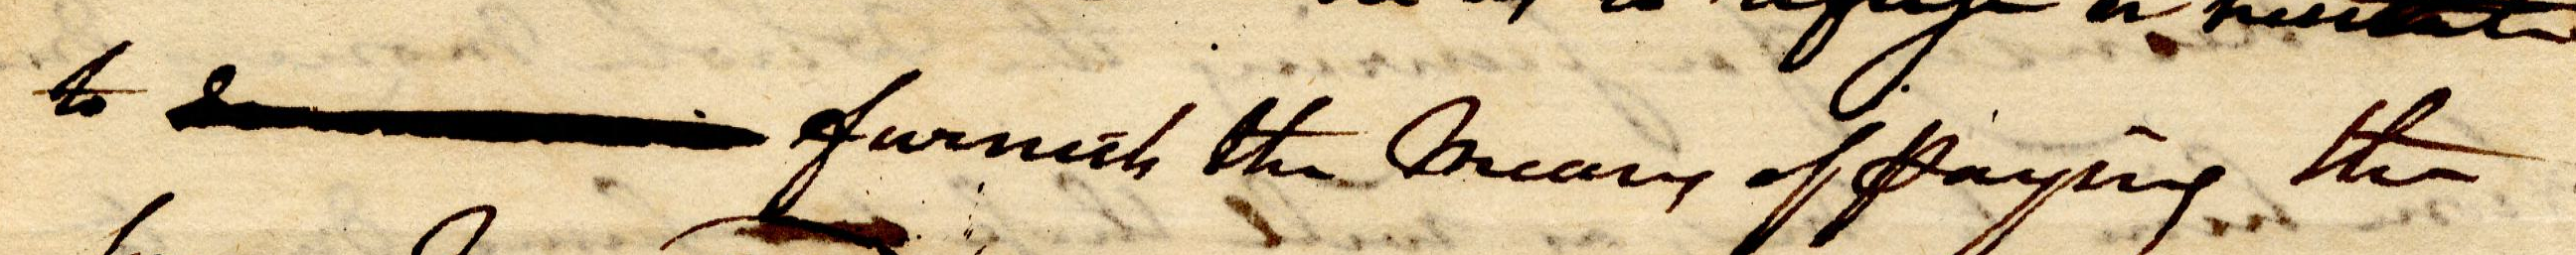to [__________] furnish the means of paying the
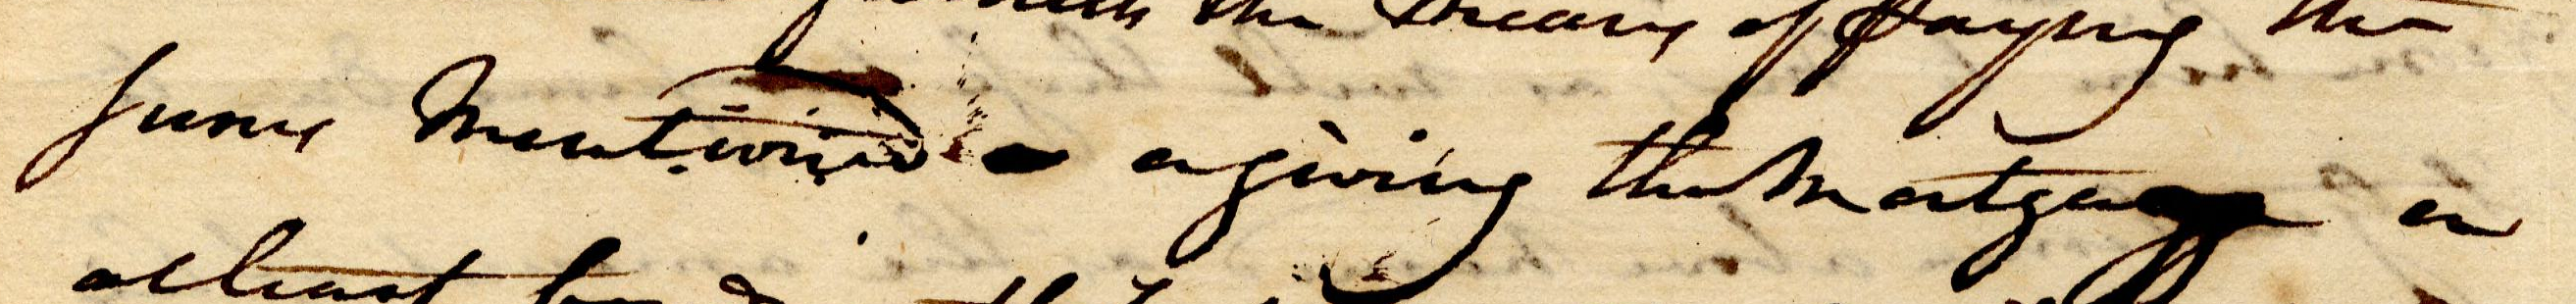sums mentioned [__] or giving the mortgage in
